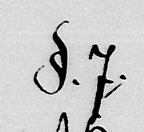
§. 7.
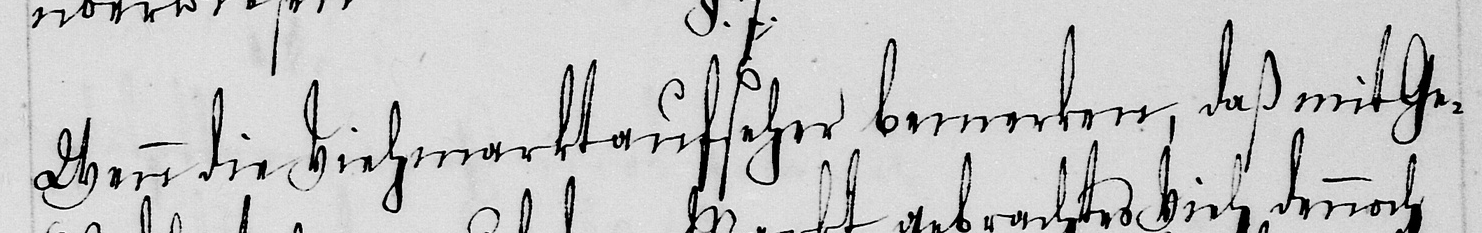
Wenn die Viehmarktaufseher bemerken, daß mit Ge¬
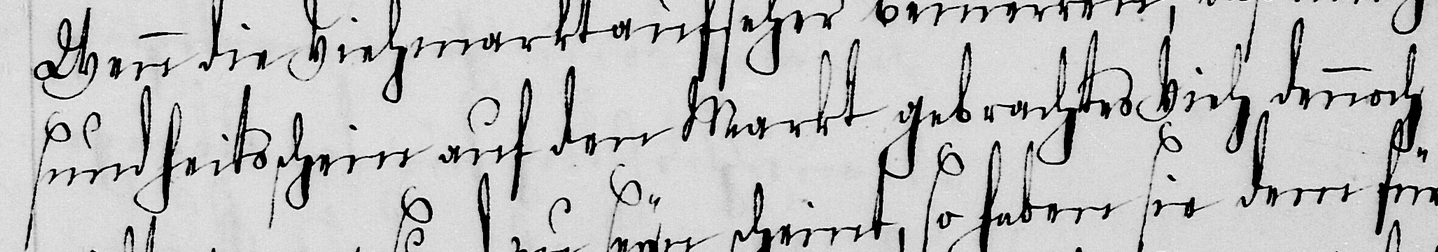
sundheitsschein auf den Markt gebrachtes Vieh denn¬
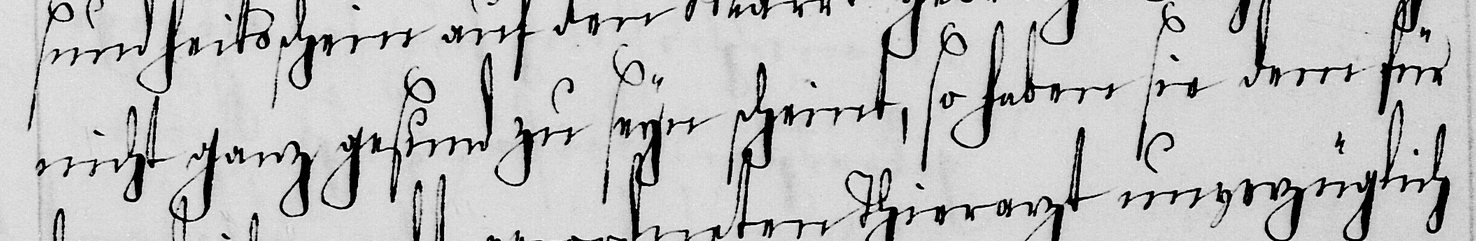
nicht ganz gesund zu seyn scheint, so haben sie
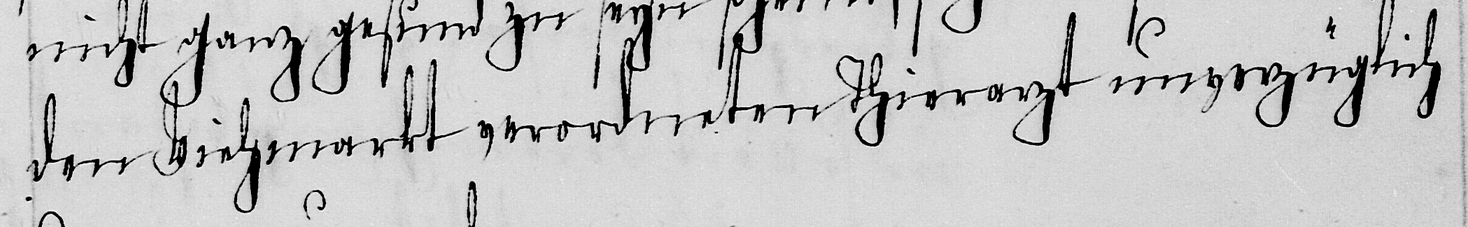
den Viehmarkt verordneten Thierarzt unverzüglich
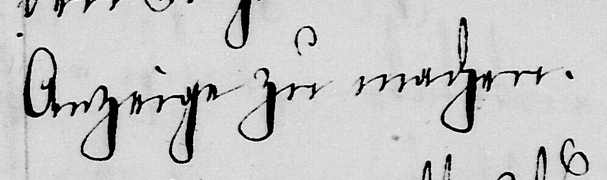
Anzeige zu machen.
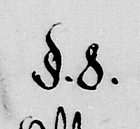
§. 8.
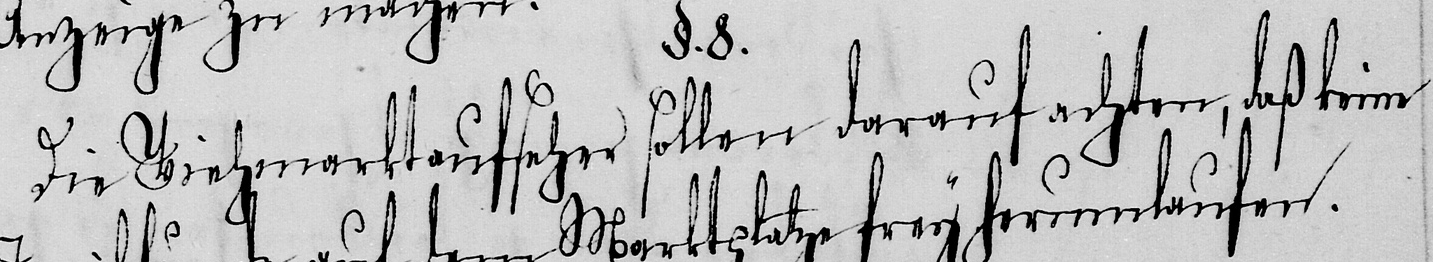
Die Viehmarktaufseher sollen darauf achten, daß keine
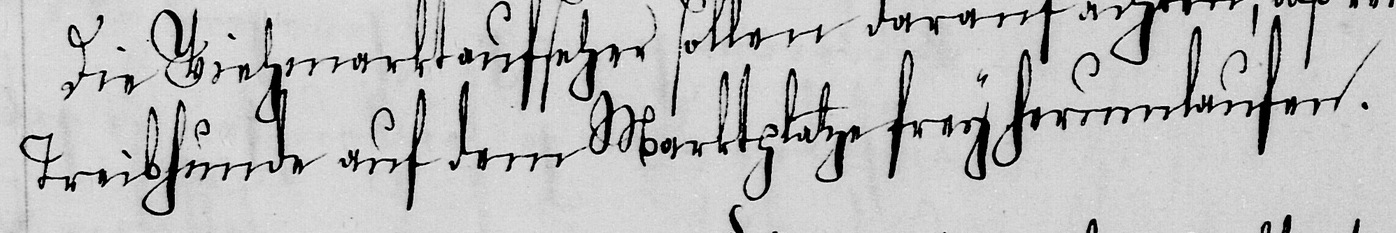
Treibhunde auf dem Marktplatze frey herumlaufen.
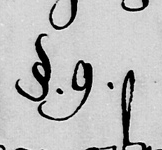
§. 9.
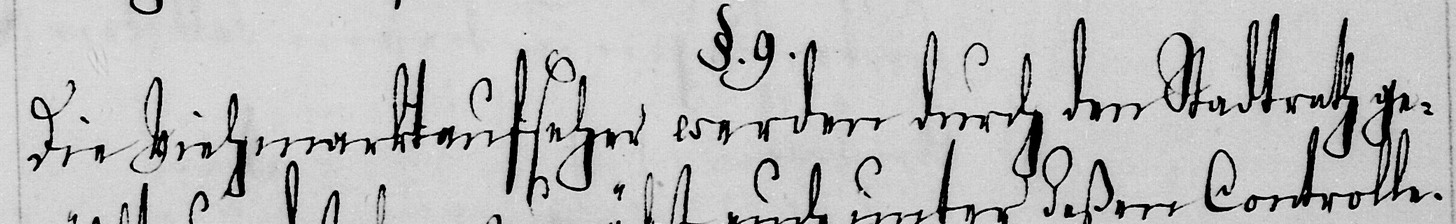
Die Viehmarktaufseher werden durch den Stadtrath g¬
